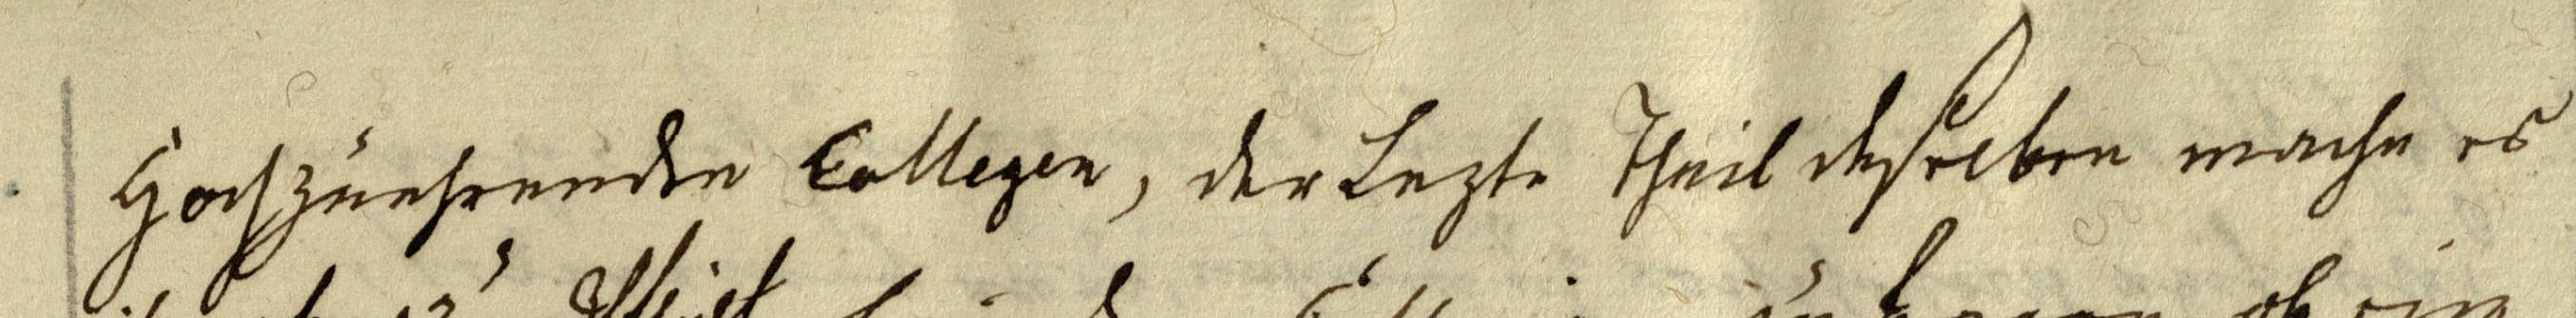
Hochzuehrenden Collegen, der Lezte Theil deßelben mache es
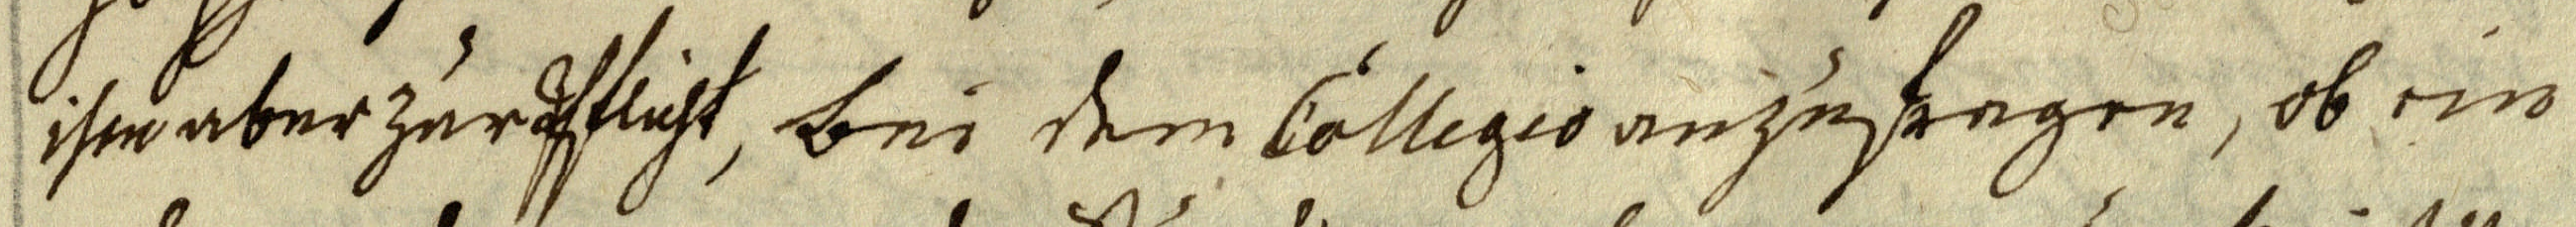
ihm aber zur Pflicht, bei dem Collegio anzufragen, ob ein
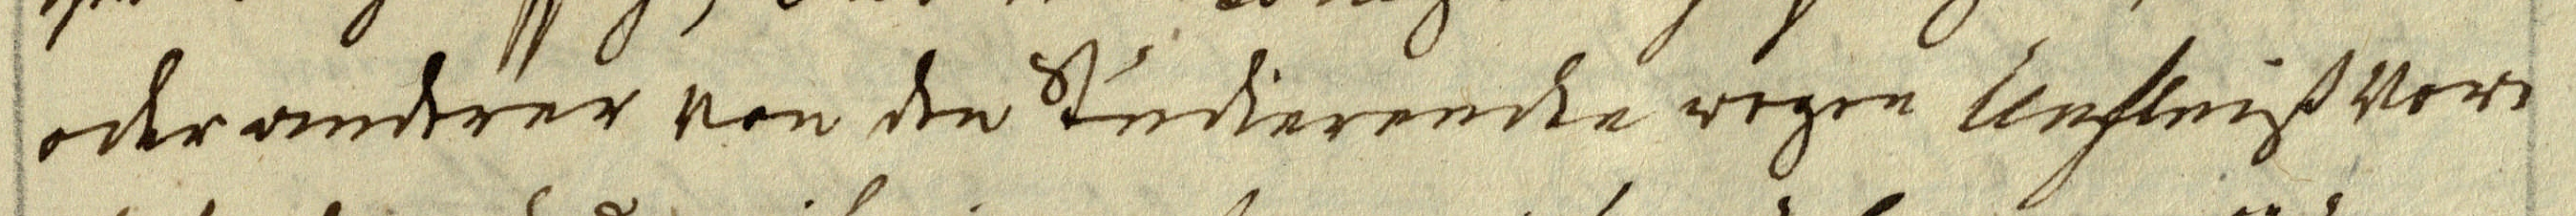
oder anderer von den Studierenden wegen Unfleiß vor¬
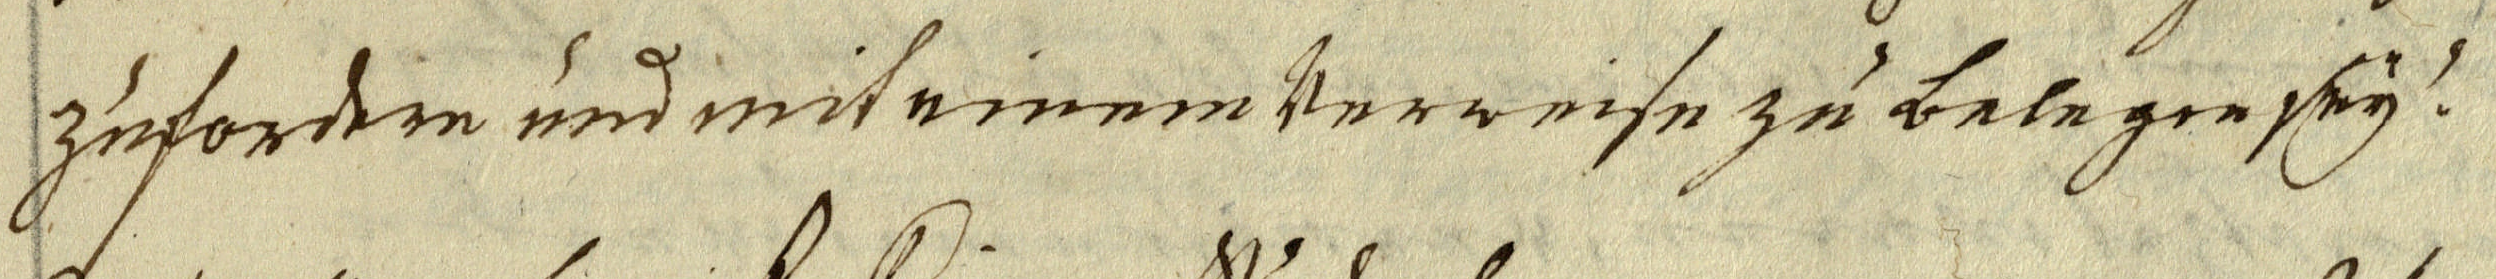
zufordern und mit einem Verweise zu belegen seÿ!
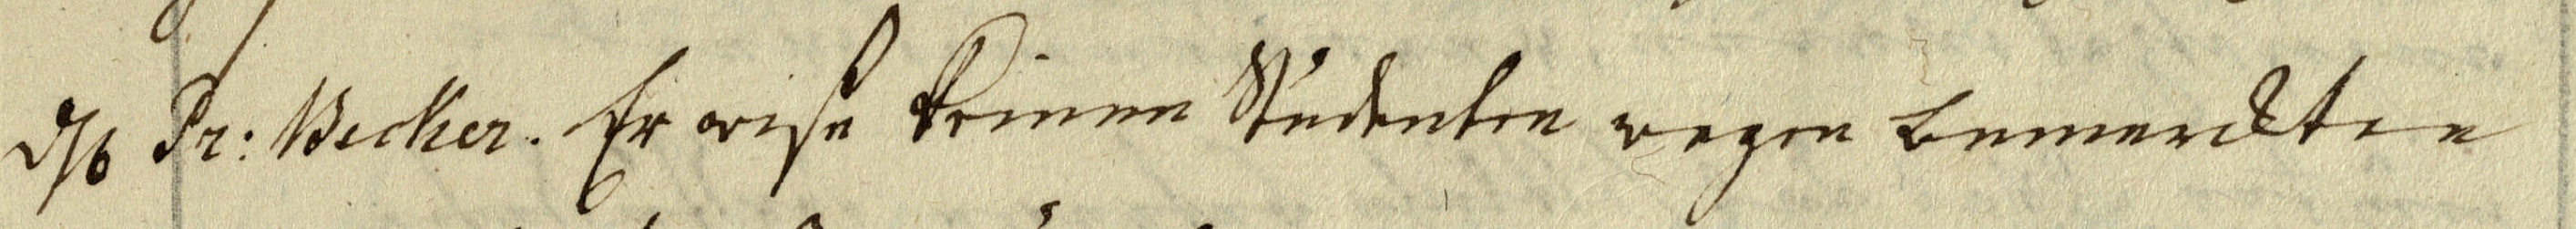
dh Pr. Becker. Er wiße keinen Studenten wegen bemerckten
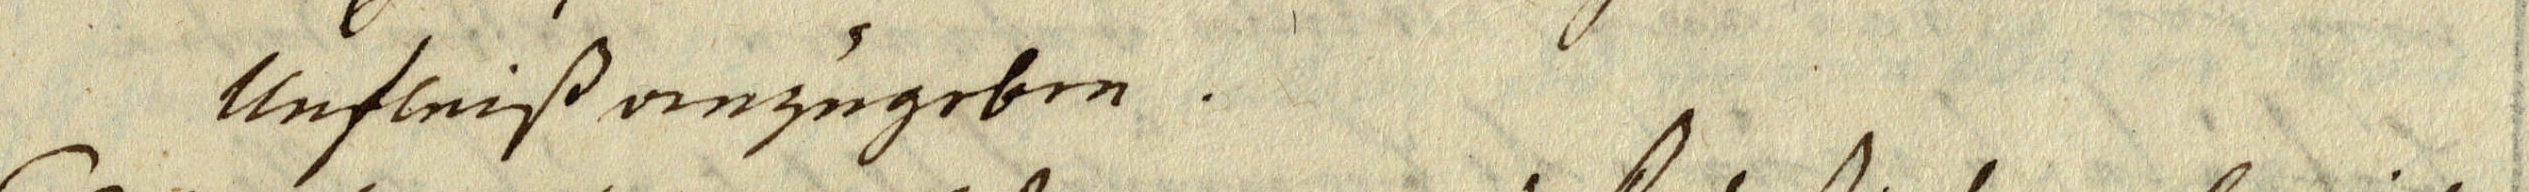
Unfleiß anzugeben.
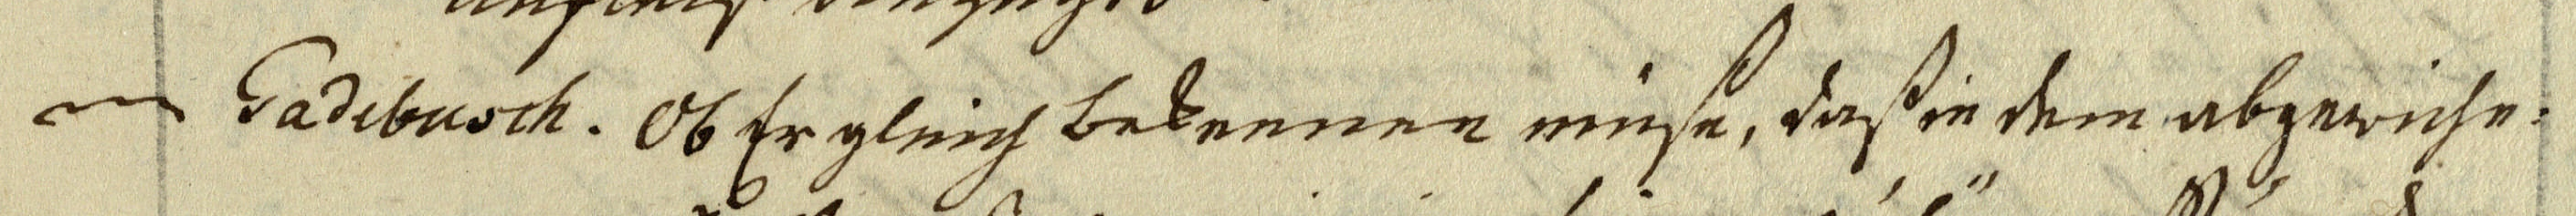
Gadebusch. Ob Er gleich bekennen müße, daß in dem abgewiche¬
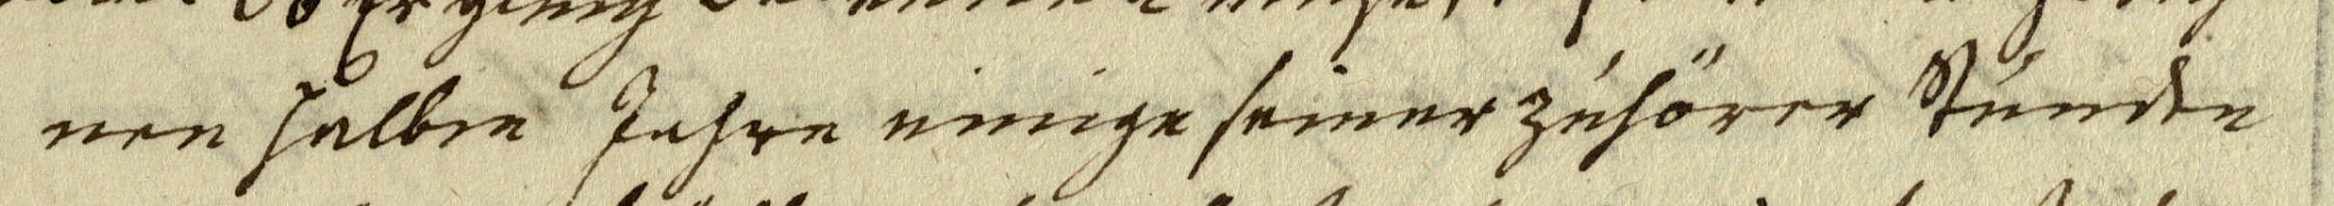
nen halben Jahre einige seiner Zuhörer Stunden
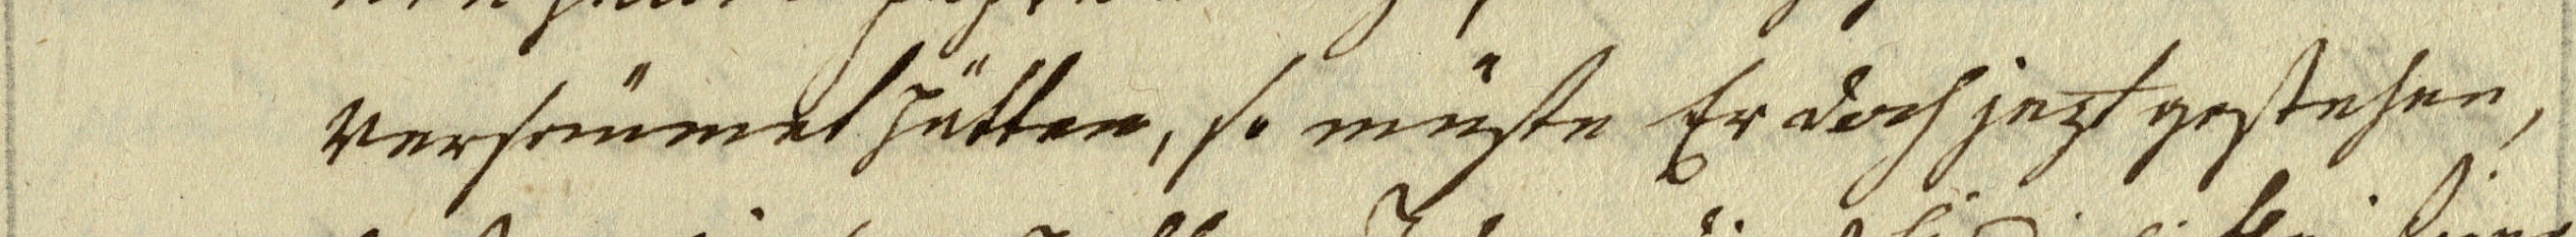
versäumet hätten, so müste Er doch jezt gestehen,
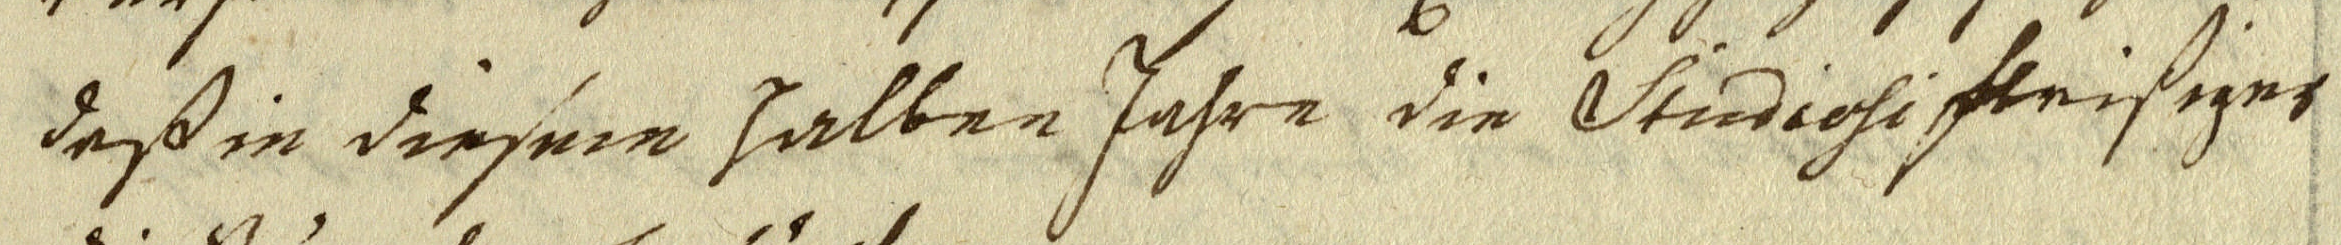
daß in diesem halben Jahre die Studiosi fleißiger
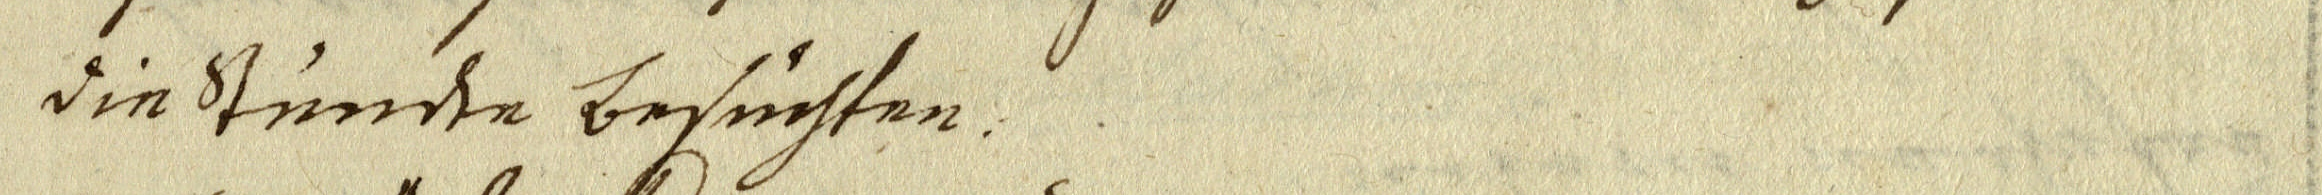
die Stunden besuchten.
